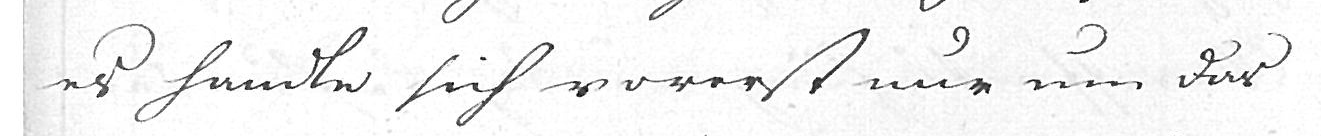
es handle sich vorerst nur um das
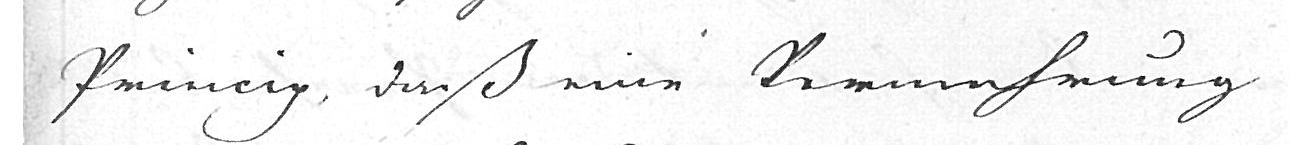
Princip, daß eine Vermehrung
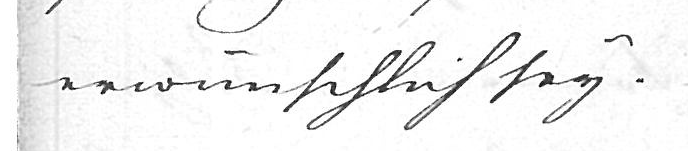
erwünschlich sey.
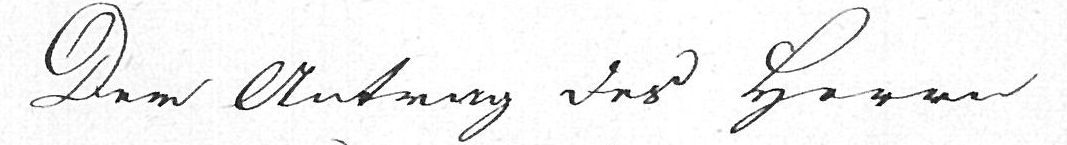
Der Antrag des Herrn
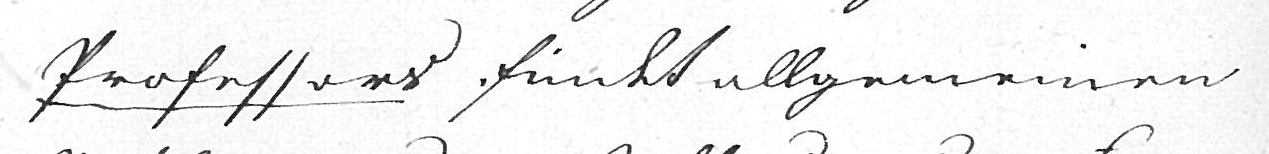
Professors findet allgemeinen
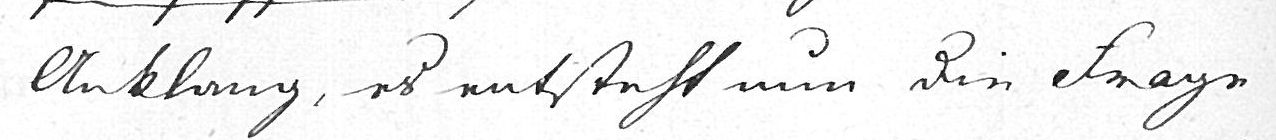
Anklang, es entsteht nun die Frage
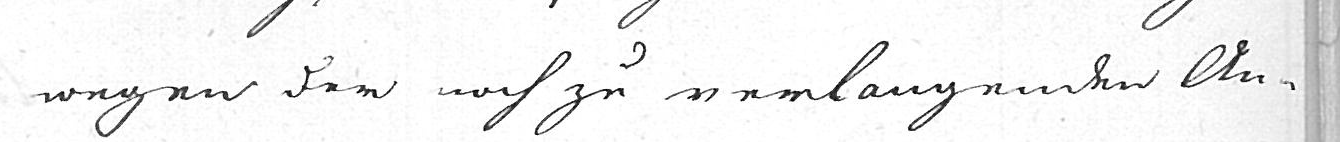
wegen der noch zu verlangenenden An-
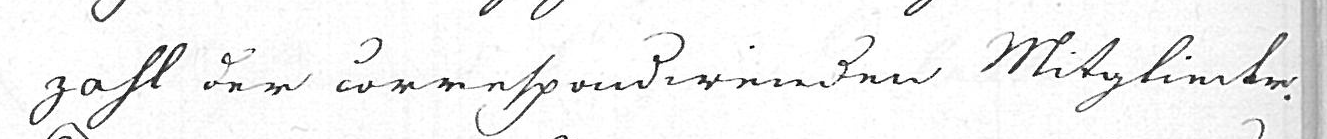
zahl der correspondirenden Mitglieder.
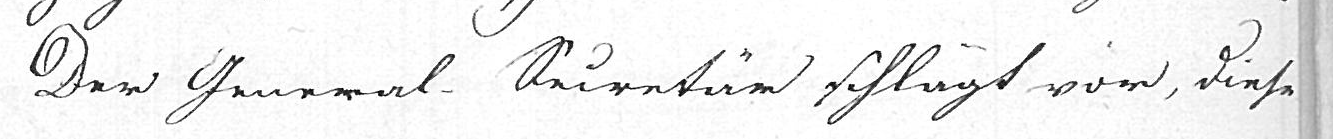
Der General-Secretär schlägt vor, diese
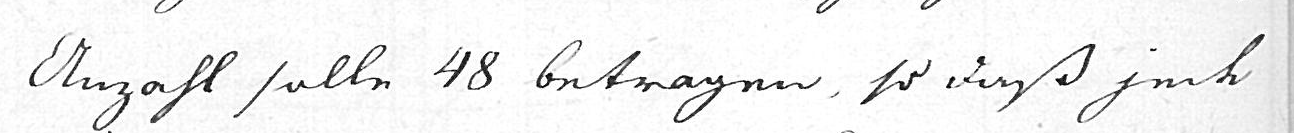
Anzahl solle 48 betragen, so daß jede
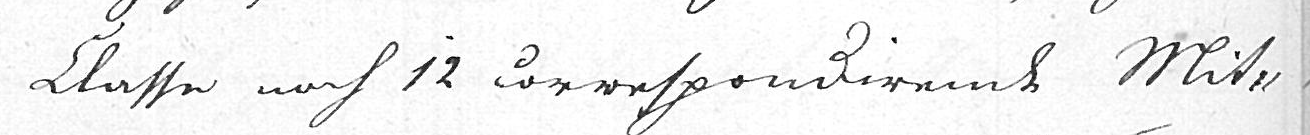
Classe noch 12 correspondirende Mit-
